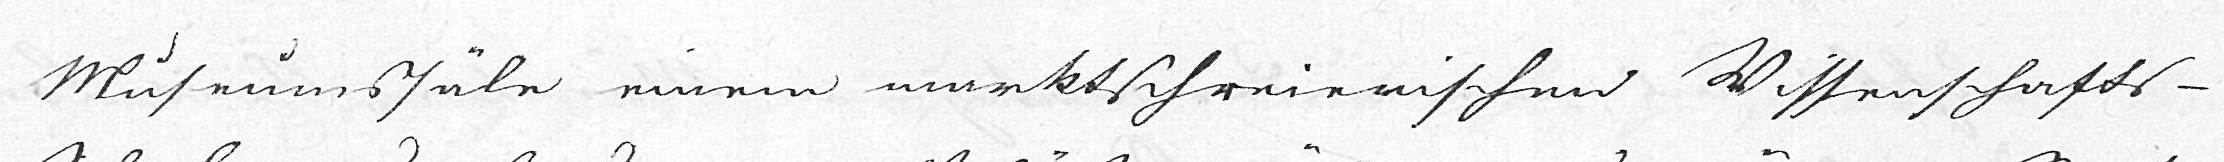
Museumssäle einen marktschreierischen Wissenschafts-
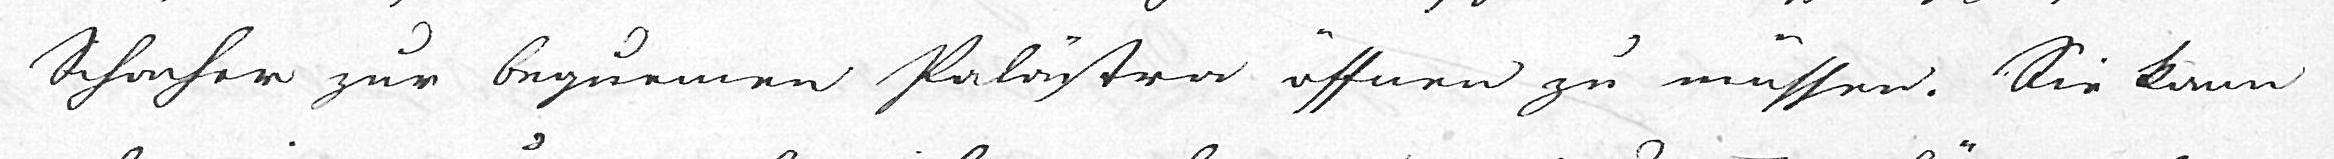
Schacher zur bequemen Palästra öffenen zu müssen. Sie kann
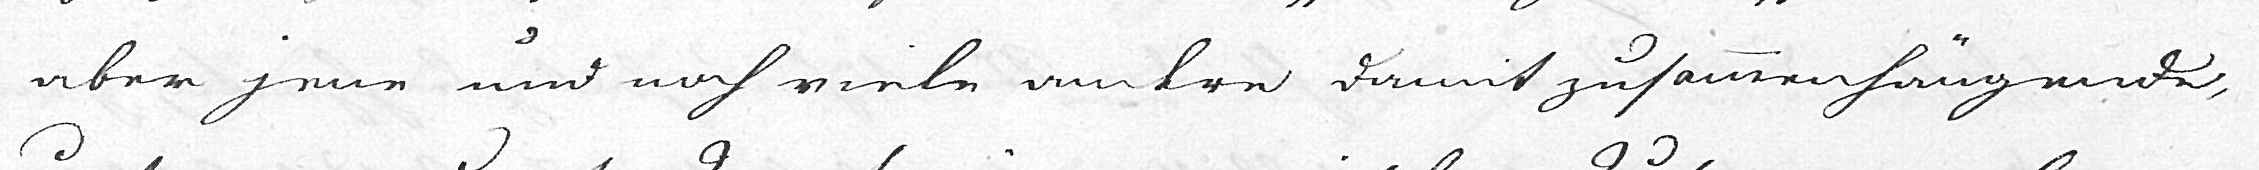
aber jene und noch viele andere damit zusammenhängende,
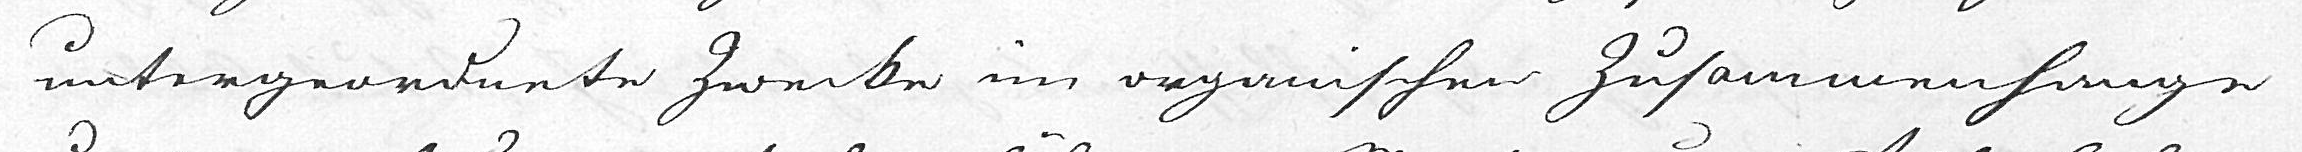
untergeordnete Zwecke im organischen Zusammenhange
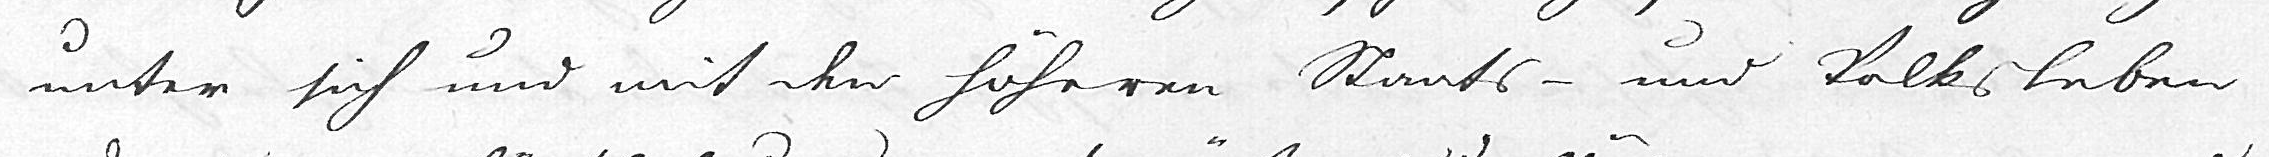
unter sich und mit den höheren Staats- und Volksleben
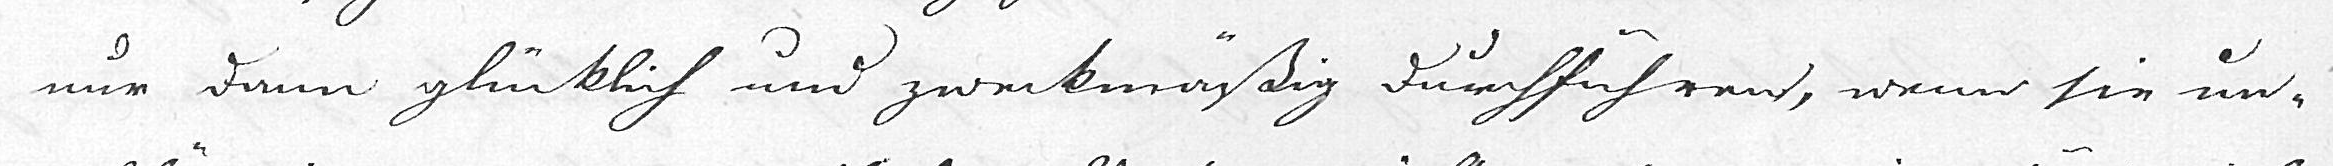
nur dann glücklich und zweckmäßig durchführen, wenn sie un-
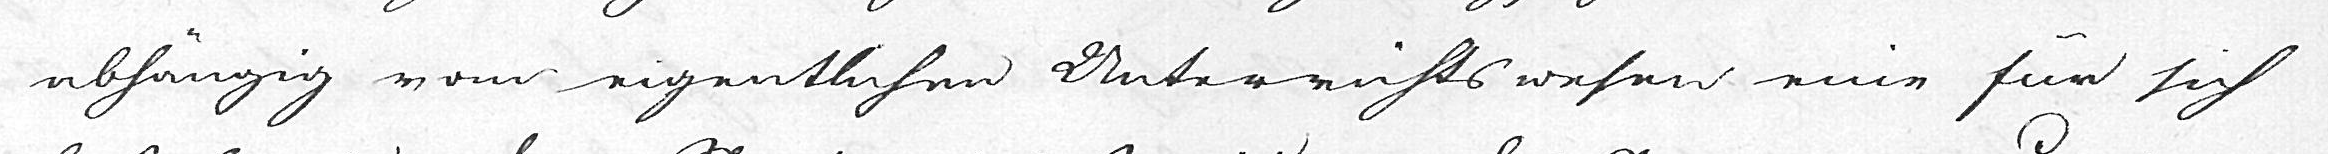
abhängig vom eigentlichen Unterichtswesen eine für sich
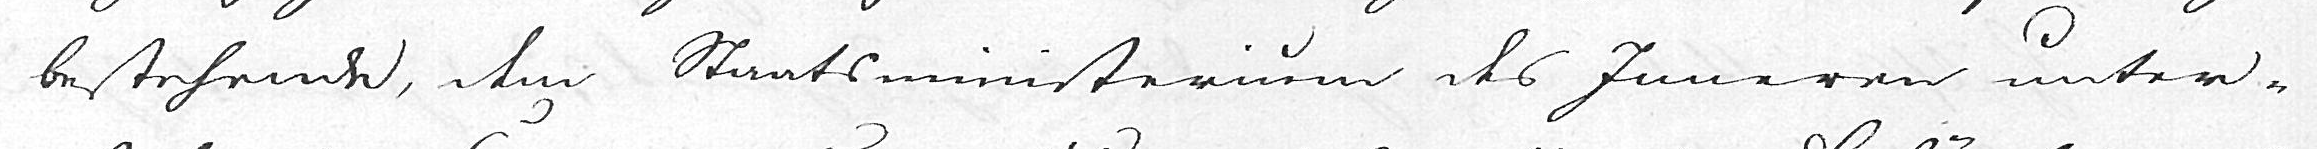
bestehende, dem Staatsmimisterum des Inneren unter-
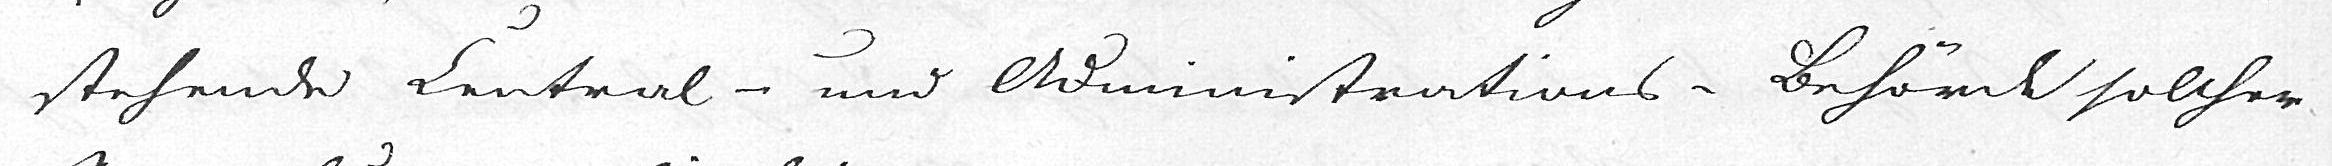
stehenden Central- und Administrations-Behörde solcher
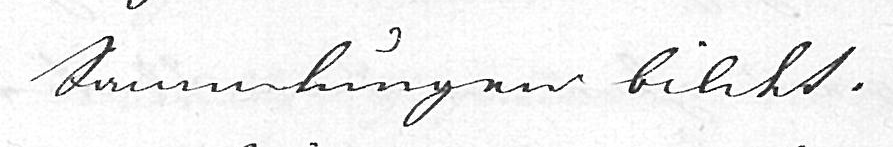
Sammlungen bildet.
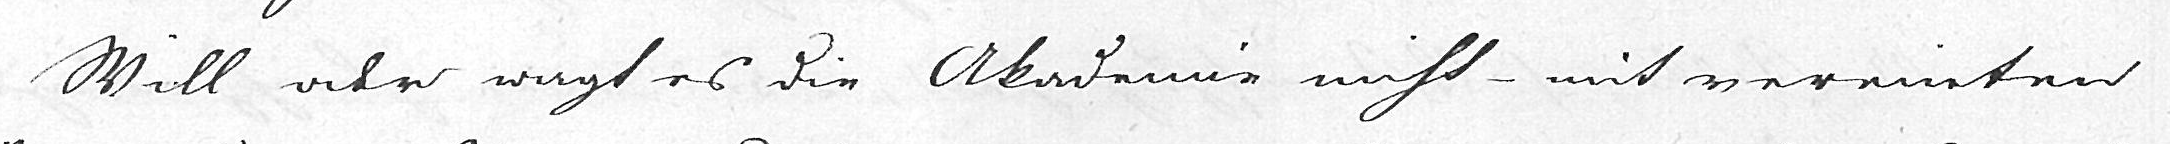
Will oder wagt es die Akademie nicht mit vereinigten
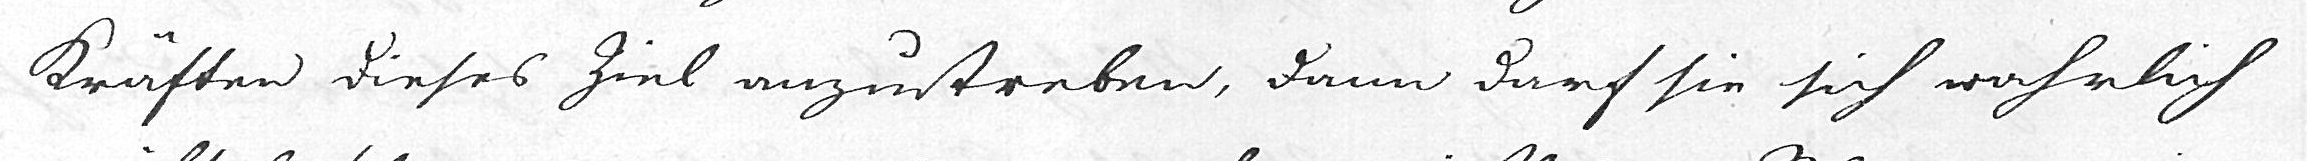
Kräften dieses Ziel anzustreben, dann darf sie sich wahrlich
